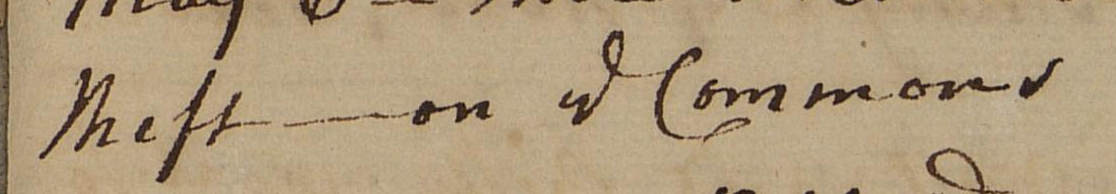theft- on y^e Commons-
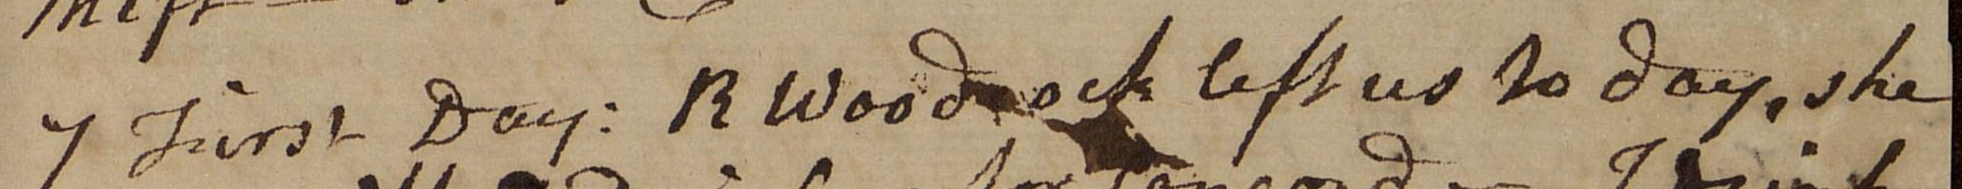7 First Day: R Woodcock left us to day, she
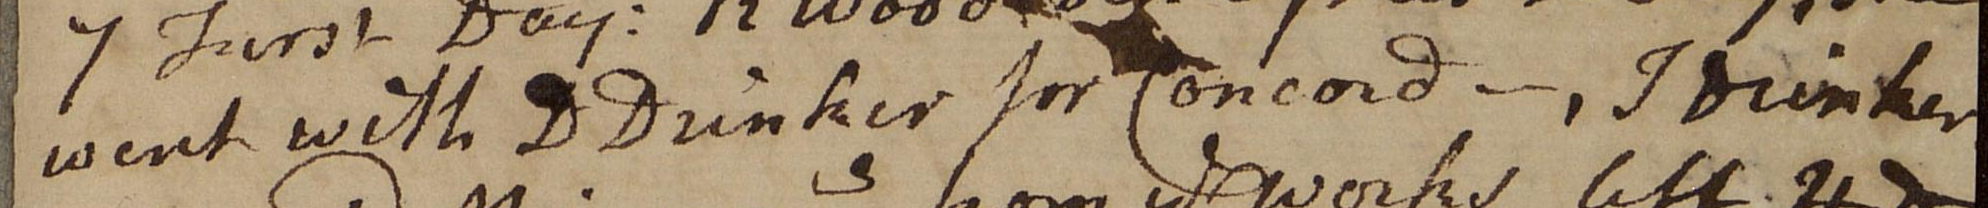went with D Drinker for Concord-, I Drinker
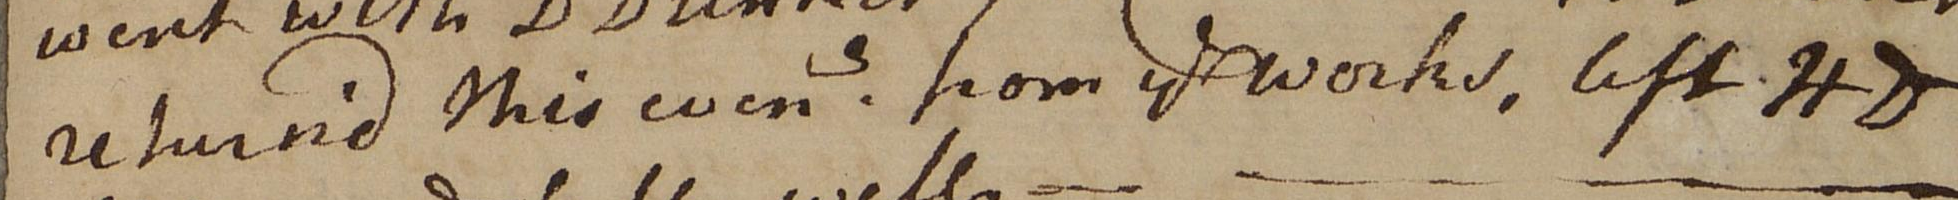return'd this even^g. from y^e works, left HD
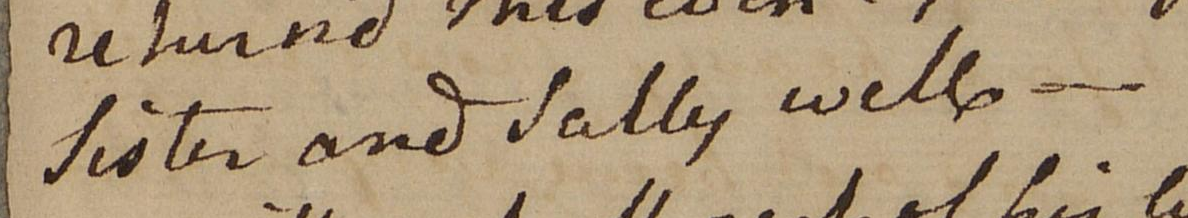Sister and Sally well-
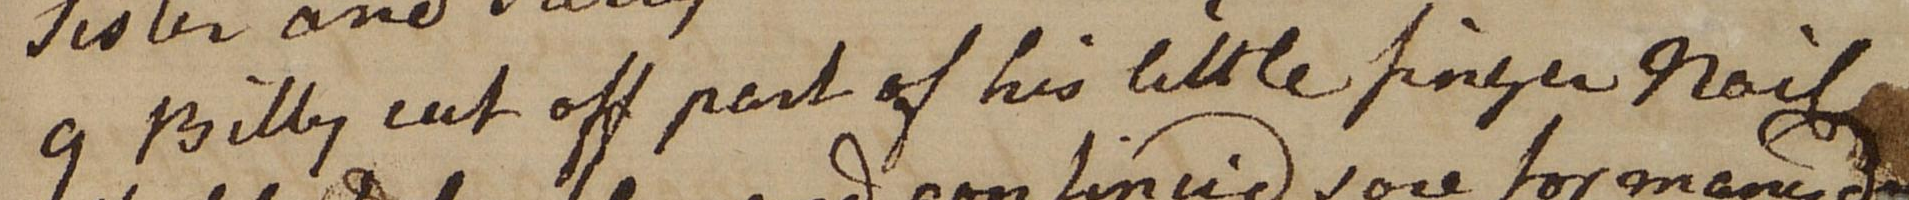9 Billy cut off part of his little finger Nail
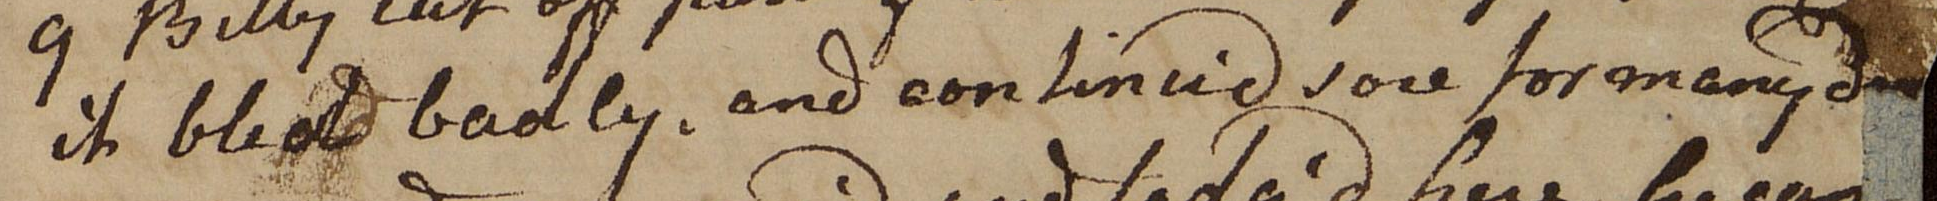it bled badly, and continu'd sore for many d
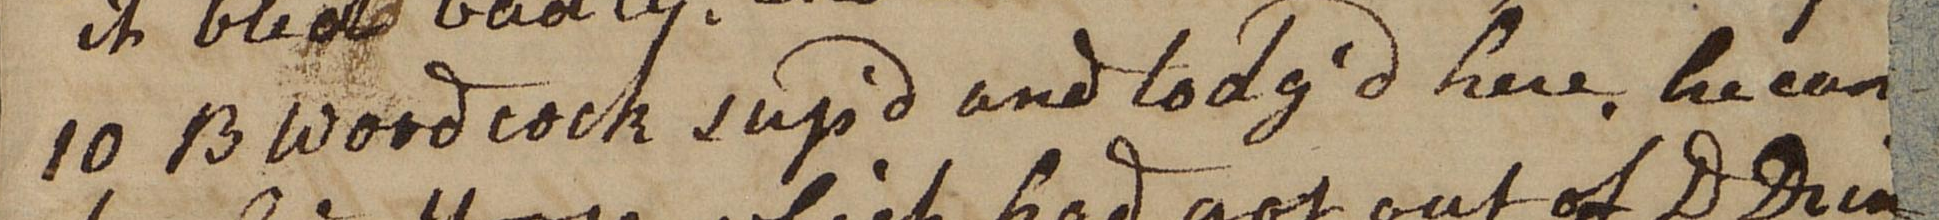10 B Woodcock sup'd and lodg'd here, he ca[m]
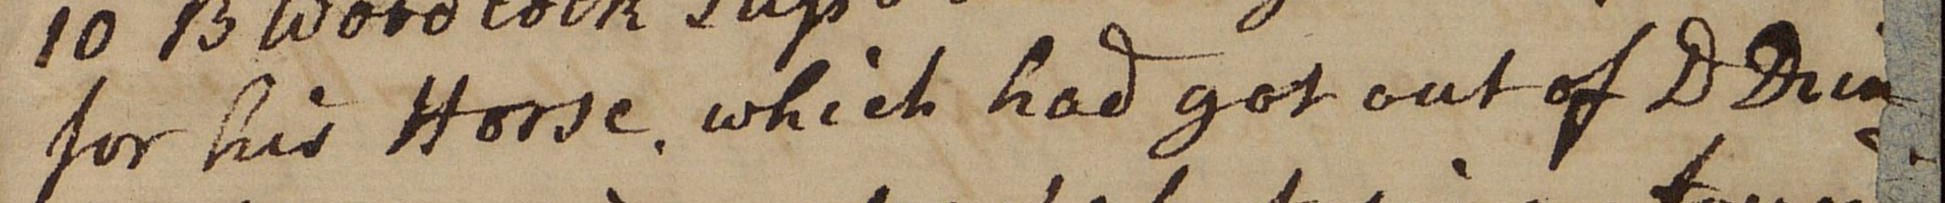for his Horse, which had got out of D Drin
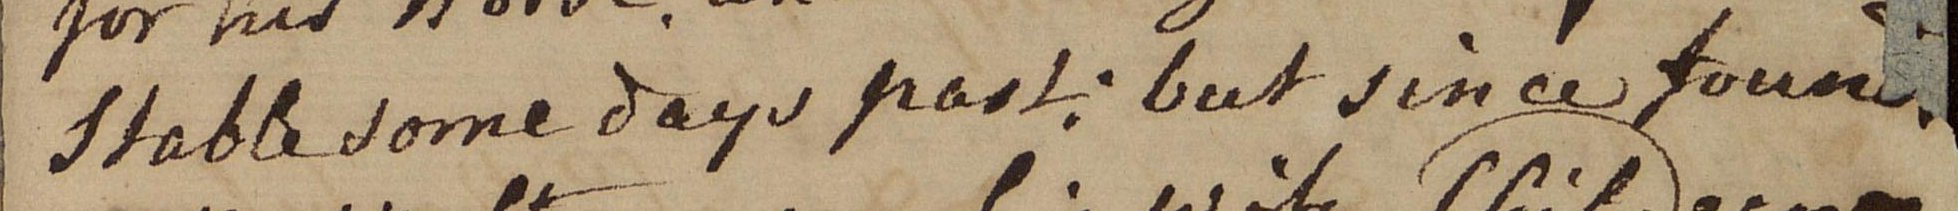Stable some days past; but since foun[d]
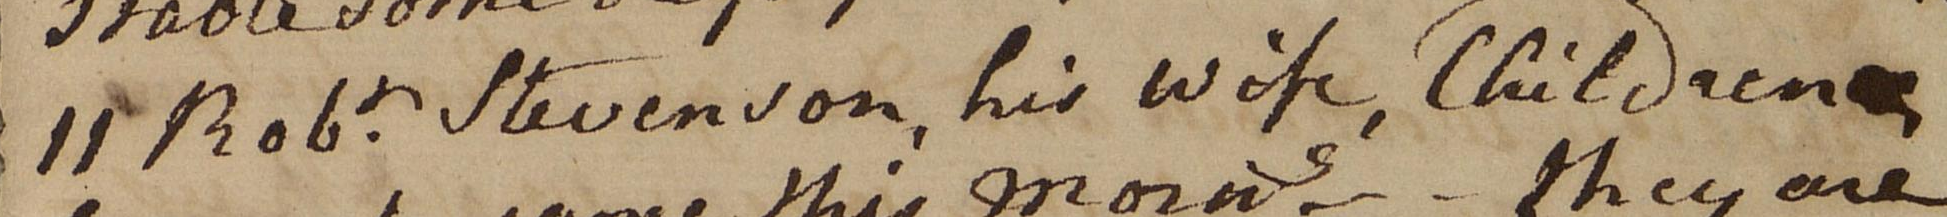11 Rob^t. Stevenson his wife, Children&
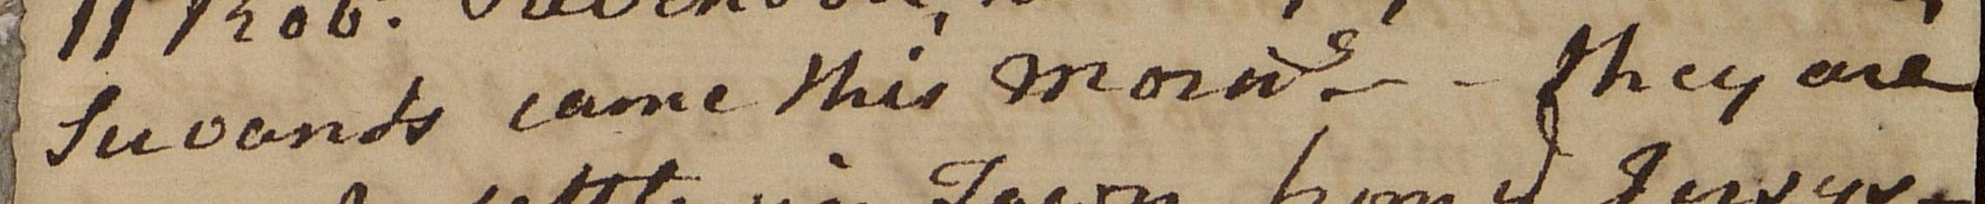Servants came this morn^g-- they are
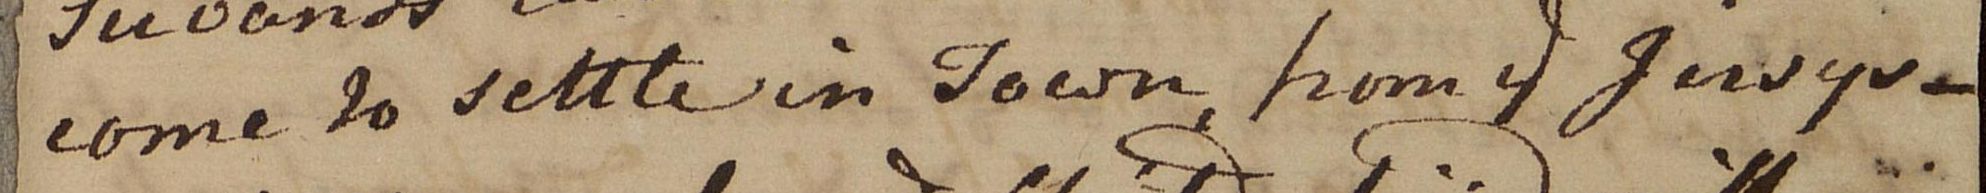come to settle in Town, from y^e Jersys-
